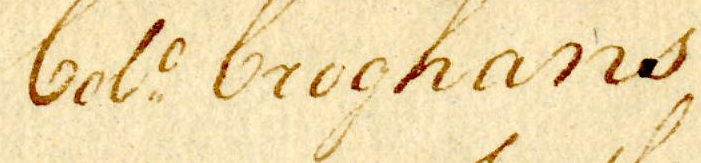Col^o. Croghans
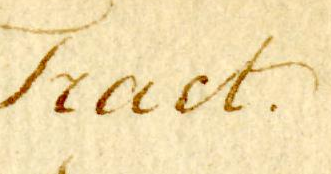Tract
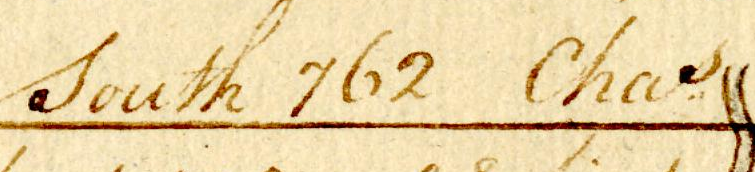South 762 Cha^s
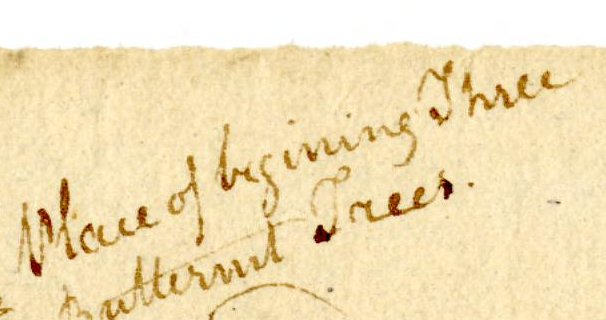Place of begining Three
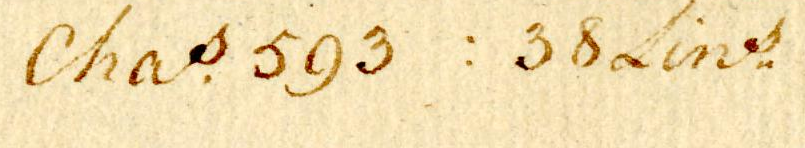Cha^s. 593: 38 Lin^s
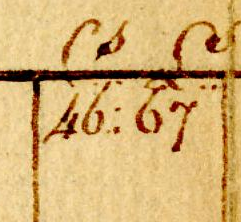46.67
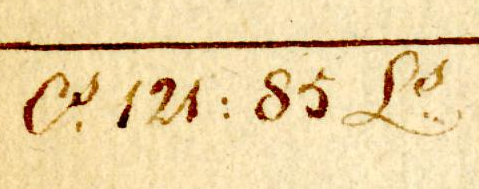C^s. 121:85 L^s
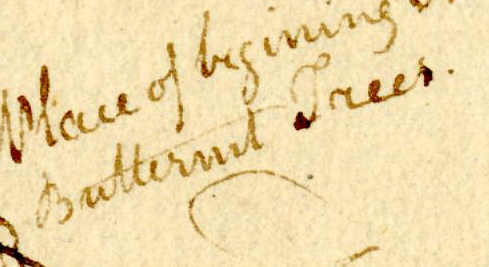Butternut Trees
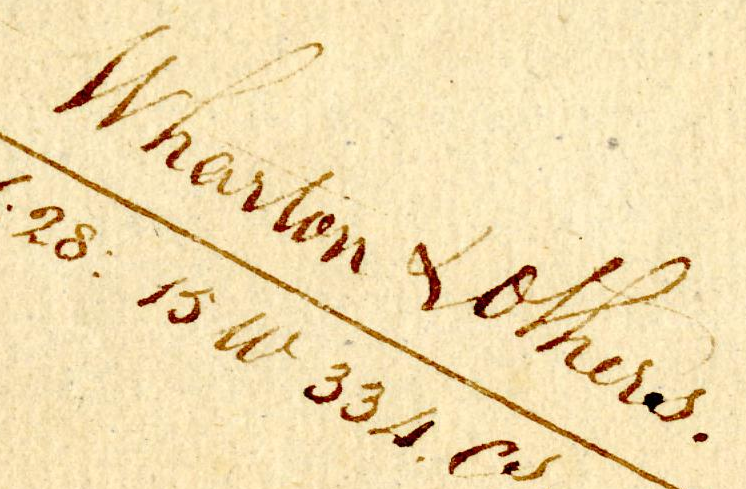Wharton & These
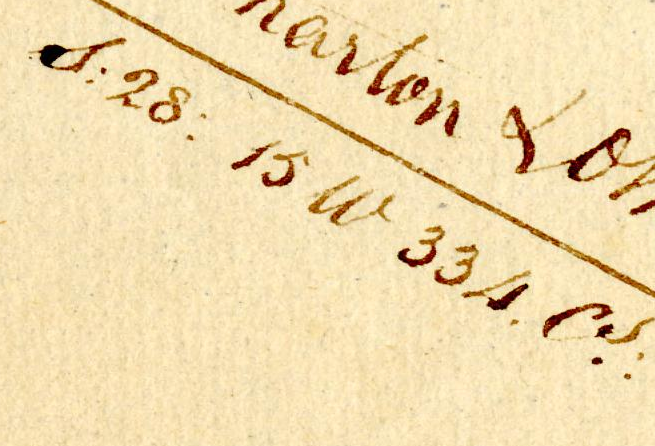S:28: 15W 334.C^s
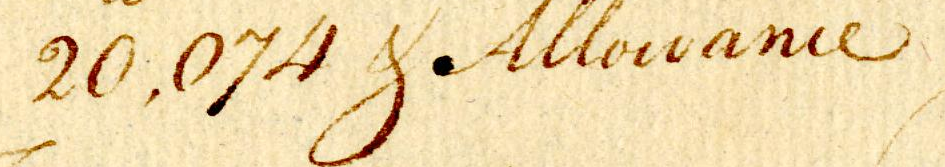20, 074 Allowance
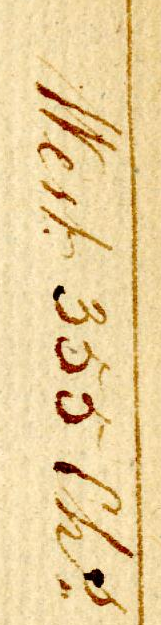West 355 Ch^s
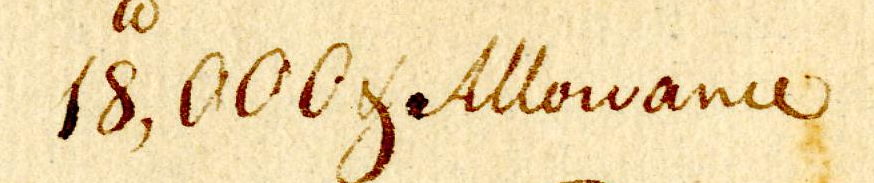18,000 Allowance
